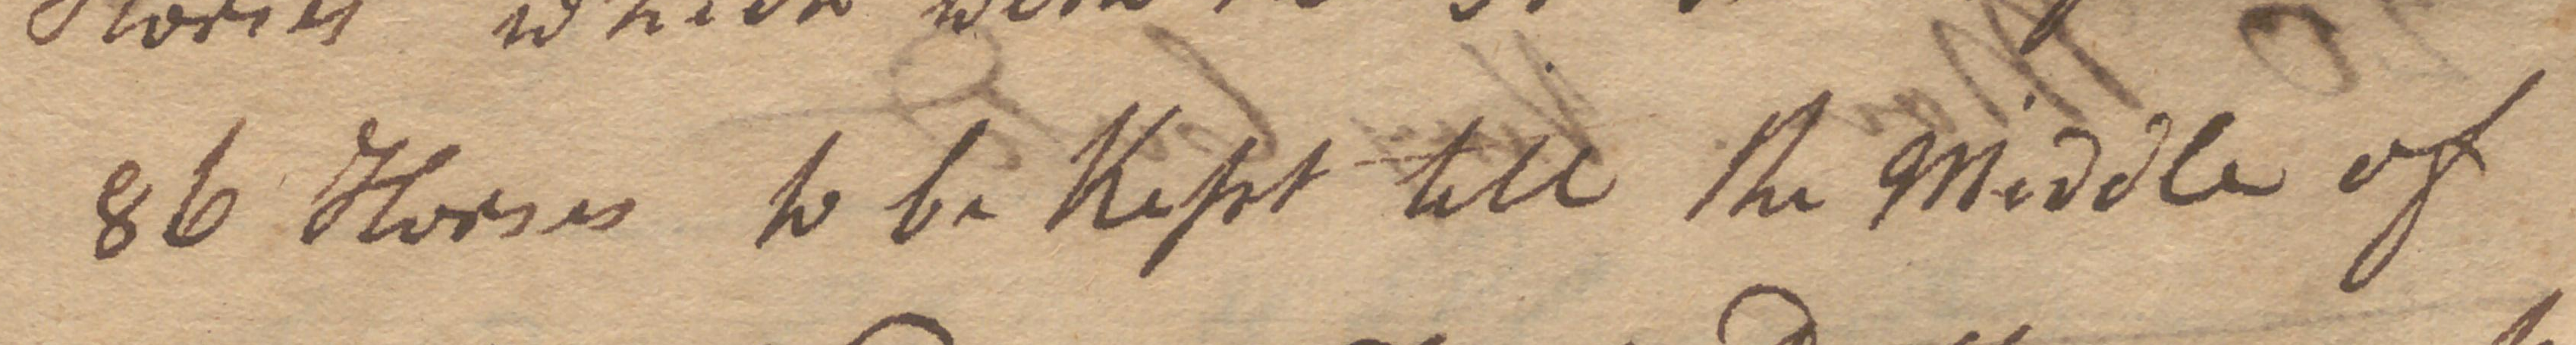86 Horses to be kept till the Middle of
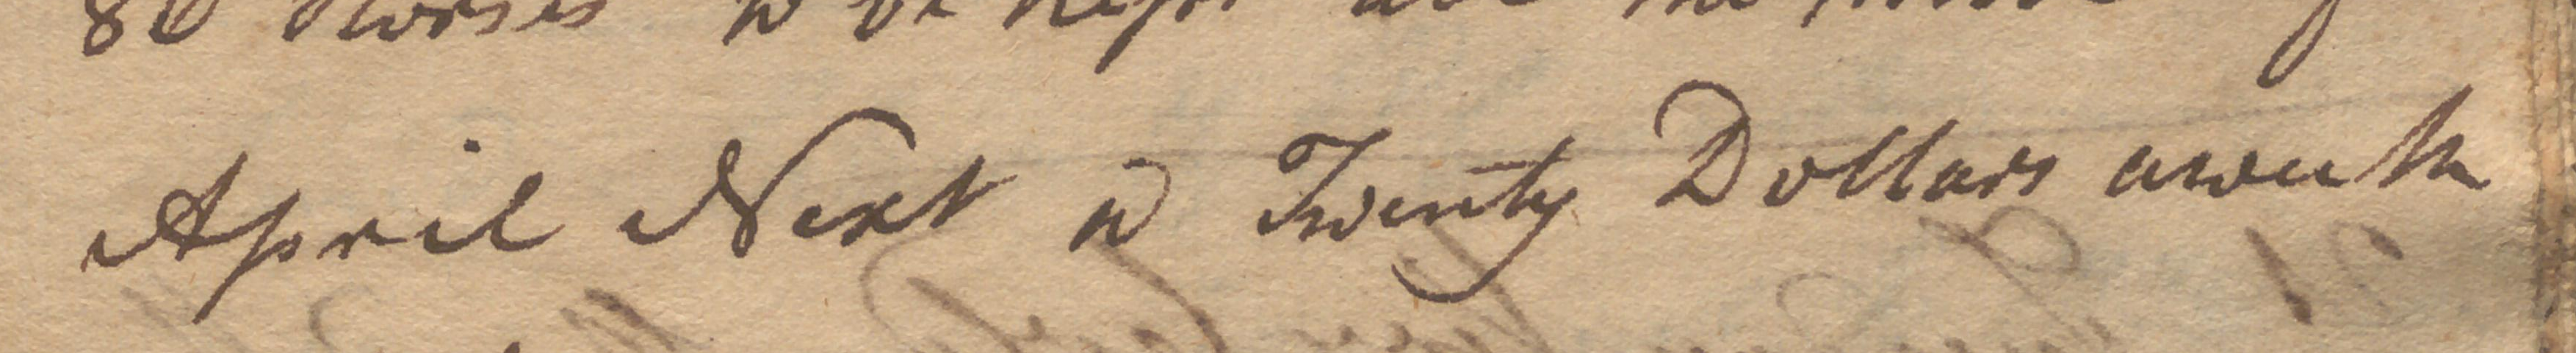April Next @ Twenty Dollars a week
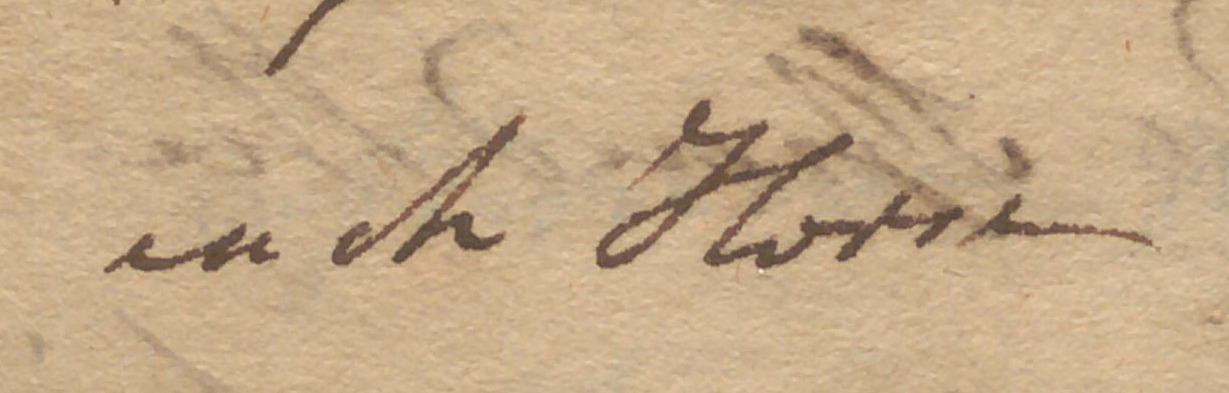each Horse
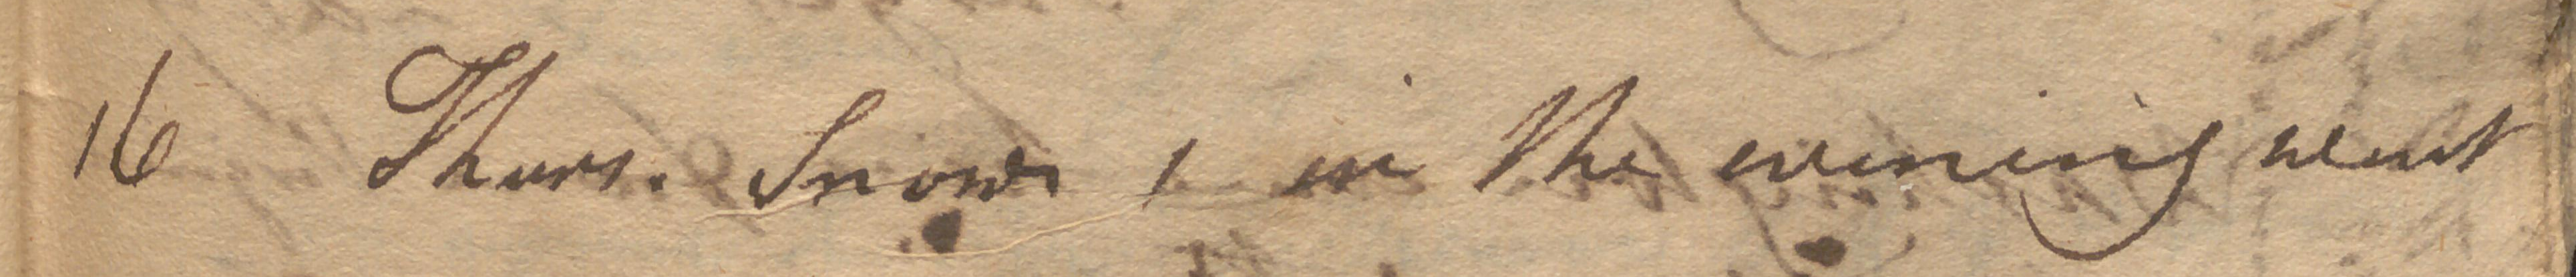16 Thurs Snow & in the evening went
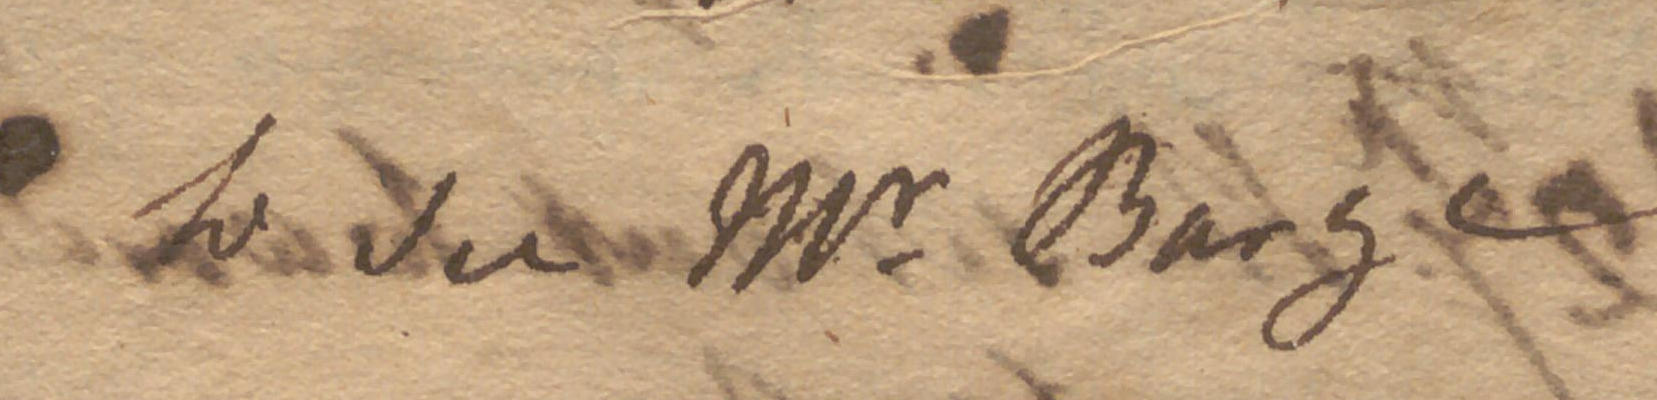to see M^r. Barge
